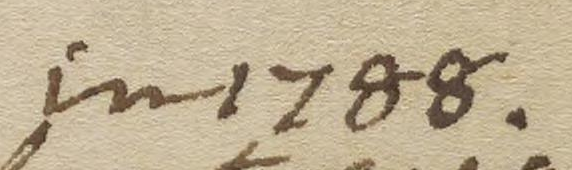in 1788
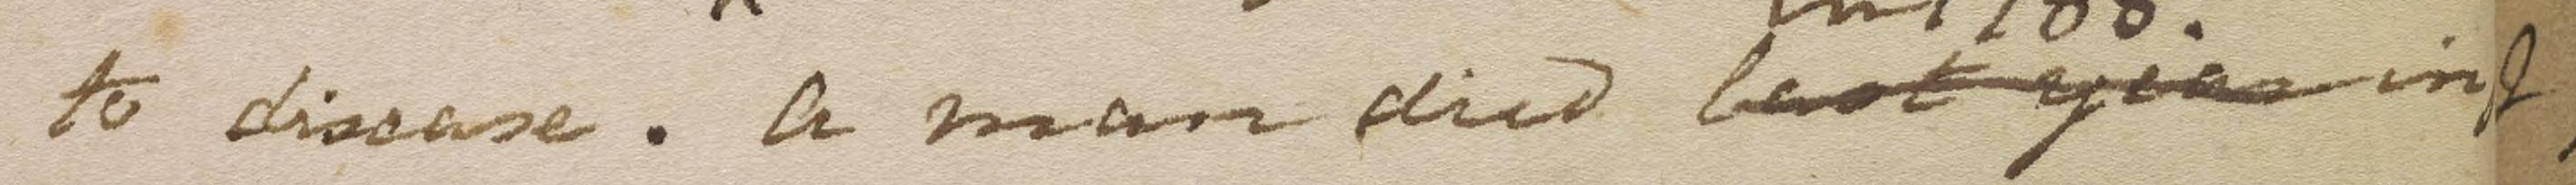to disease. A man died [last year] in
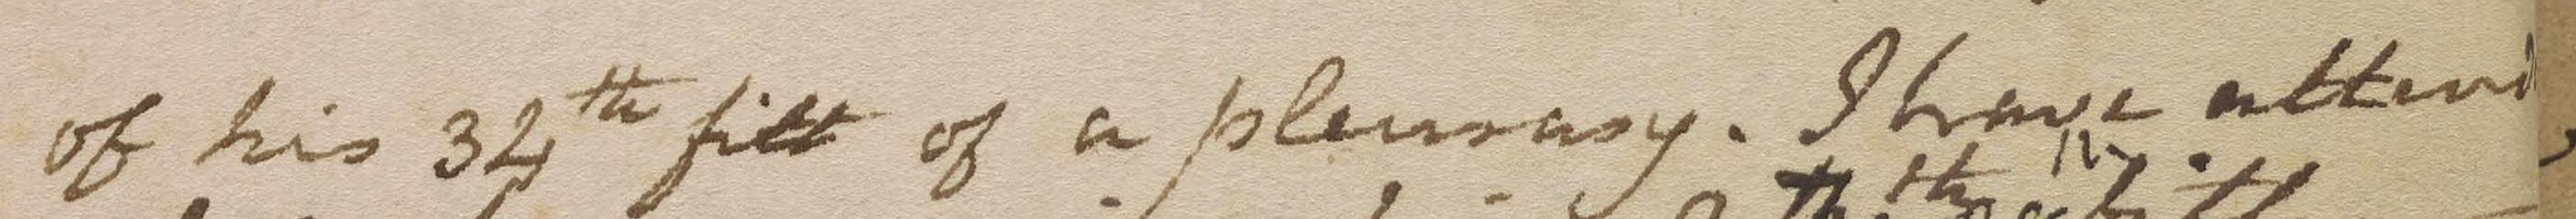of his 32th fitt of a pleurasy. I have attend
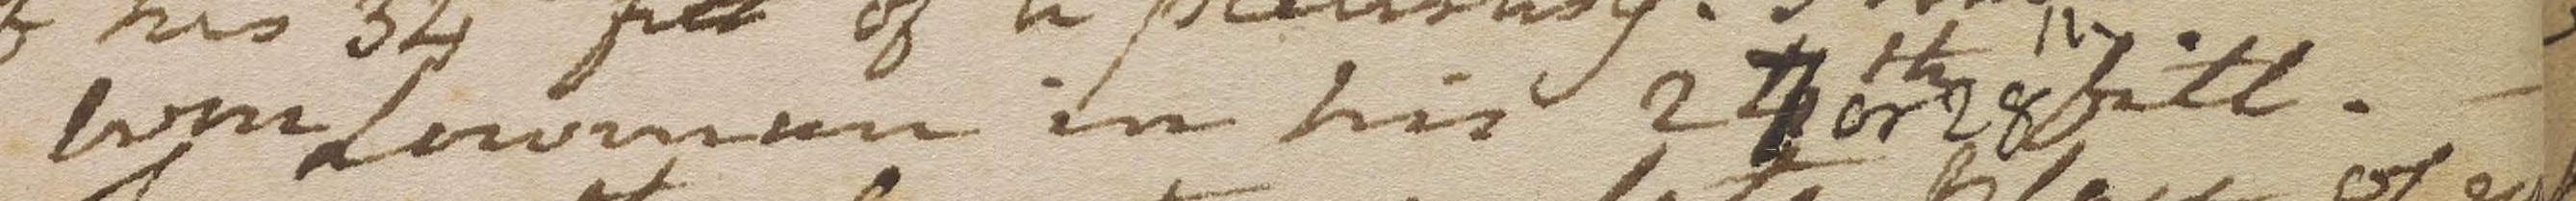W^m Lowman in his 27th or 28 fitt.
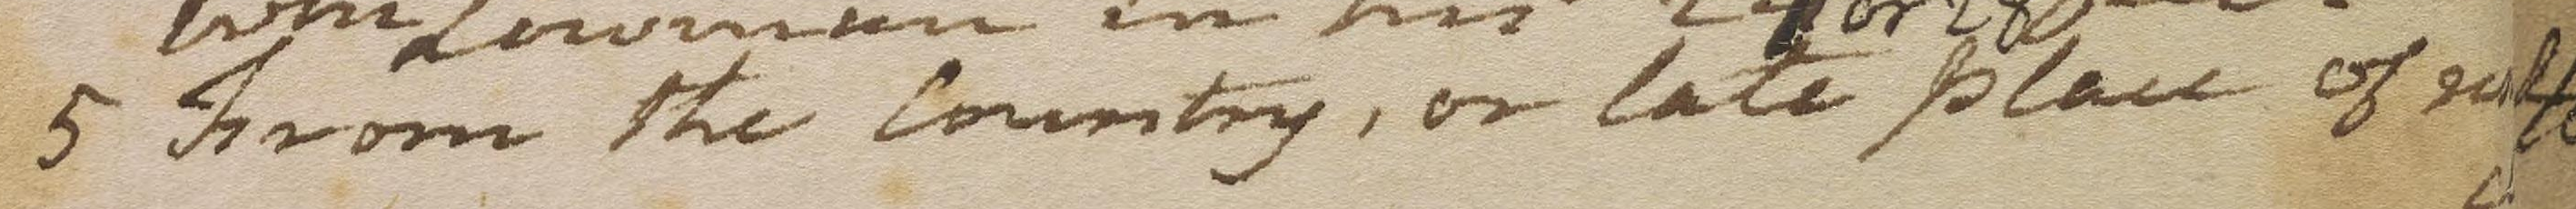5 From the Country, or late place of se[__]
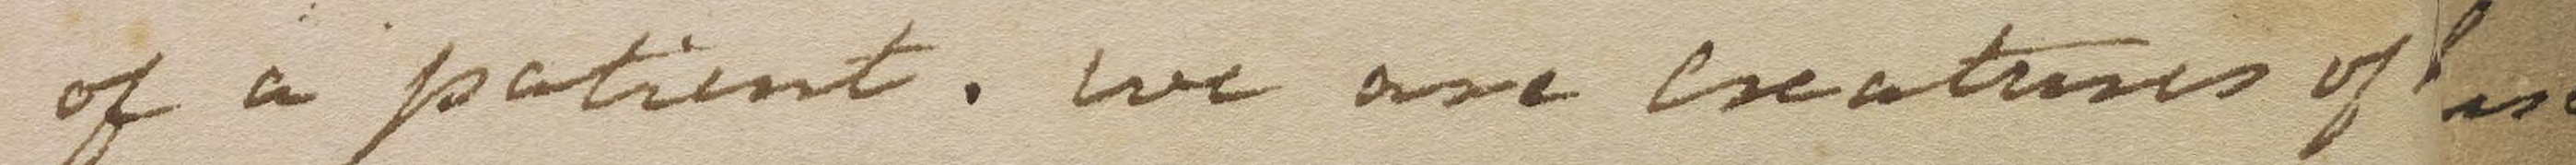of a patient. We are creatures of
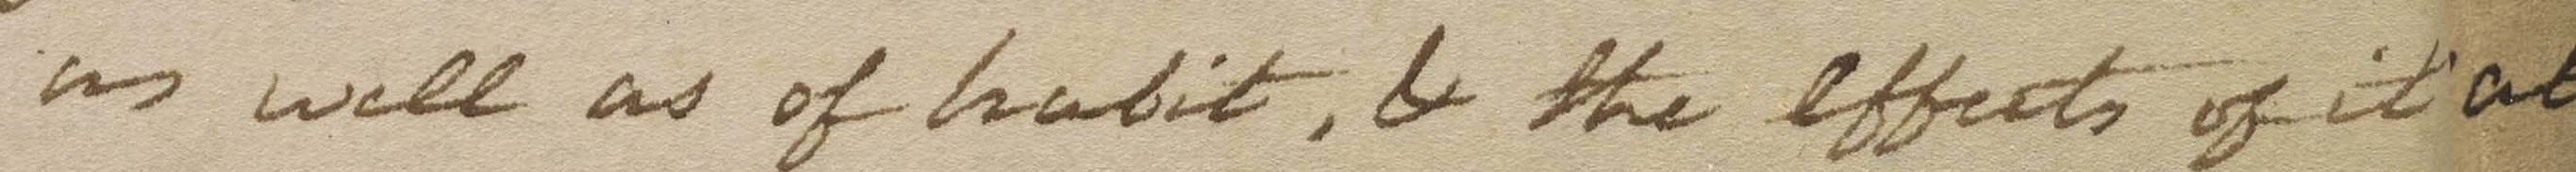as well as of habit, & the effects of it
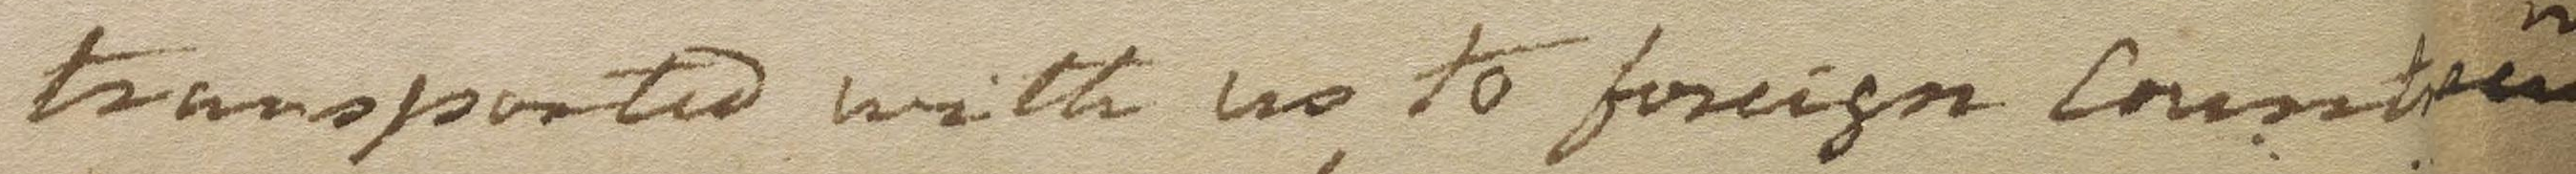transported with us to foreign countries
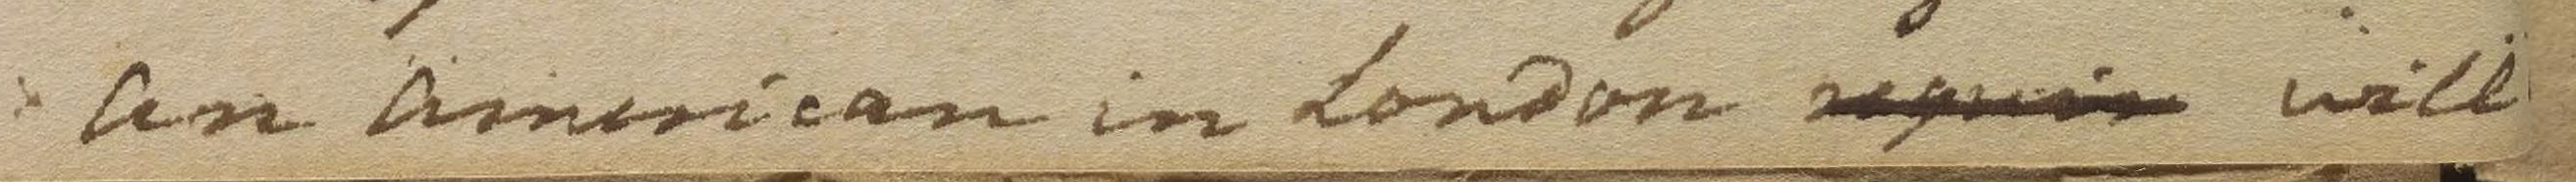an American in London requir will
